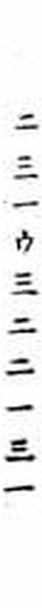十二三一ウ三二二一三一
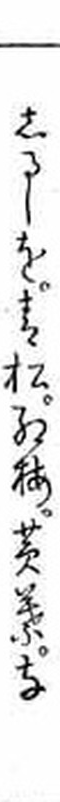しるしを。青松。紅梅。黄葉。な
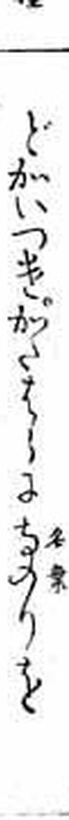どかいつけ。かたはらになのりを
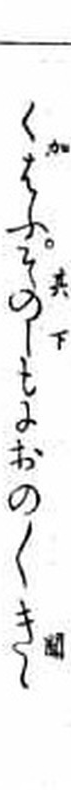くはふ。そのしもにおの〳〵きゝ
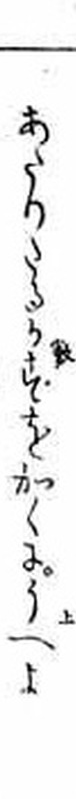あたりたるかずをかくに。うへよ
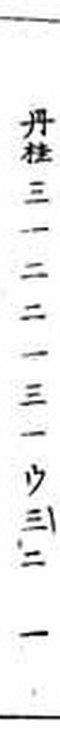録丹桂三一二二一三一ウ三二一
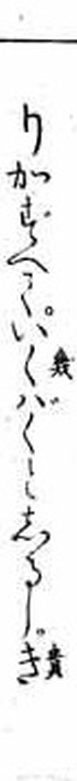りかずへて。いくばくとしるし。き
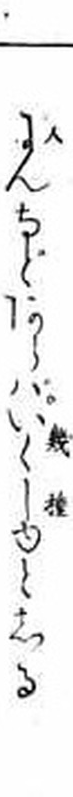にんなどあらば。いくしゆとしる
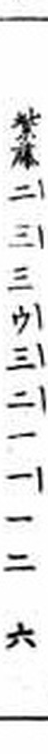図紫麻二三三ウ三二一一一二六
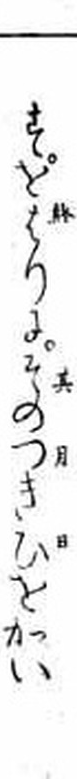す。をはりに。そのつきひをかい
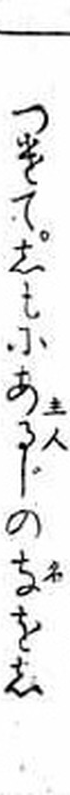つけて。しもにあるじのなをし
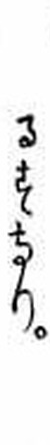るすなり。
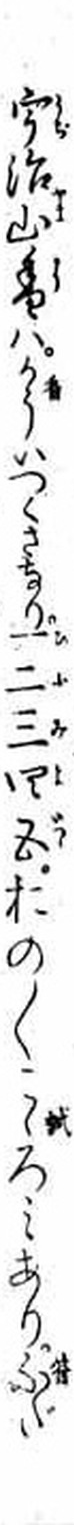宇治山香は。かういつくさなり。一二三四五。おの〳〵こゝろみあり。ふだ
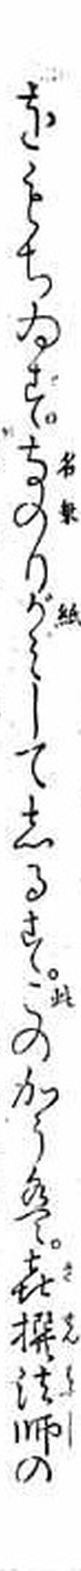をもちゐず。なのりがみしてしるす。このかうは。喜撰法師の
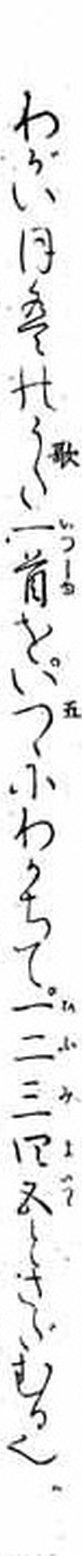わがいほはのうた一首を。いつゝにわかちて。一二三四五とさだむる也。
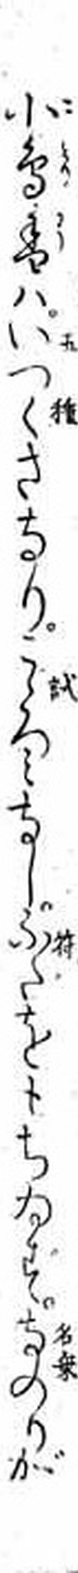小鳥香は。いつくさなり。こゝろみなし。ふだをもちゐず。なのりが
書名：女学範
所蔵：東京学芸大学教育コンテンツアーカイブ
